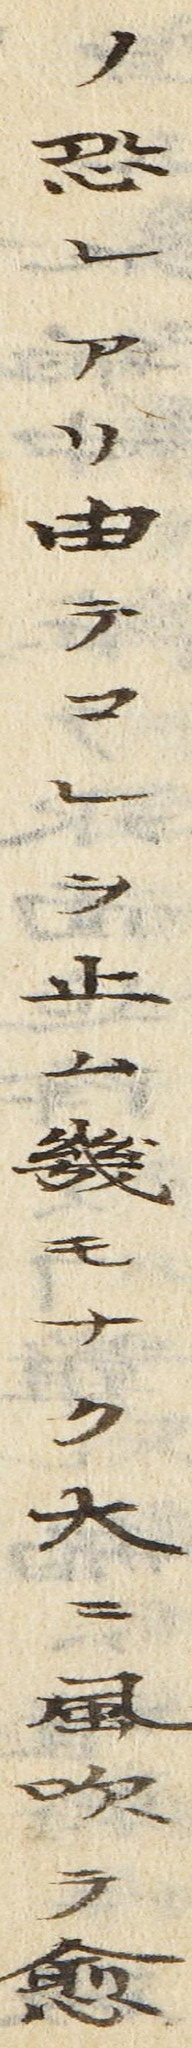ノ恐レアリ由テコレヲ止ム幾モナク大ニ風吹テ愈
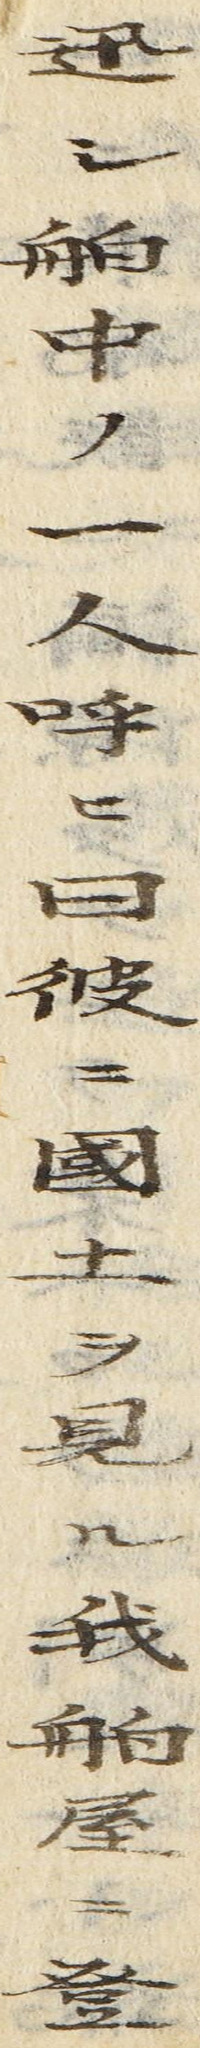迅シ舶中ノ一人呼ヒ曰彼ニ国土ヲ見ル我舶屋ニ登
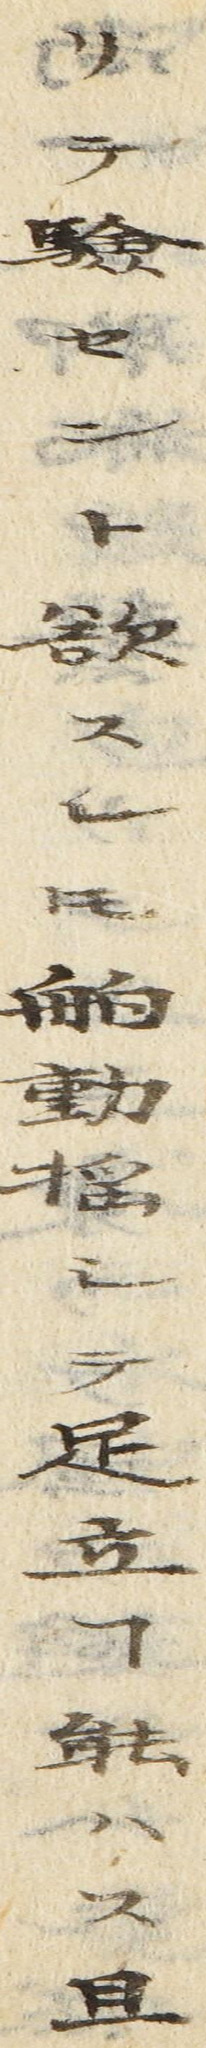リテ験セント欲スレトモ舶動揺シテ足立コト能ハス且
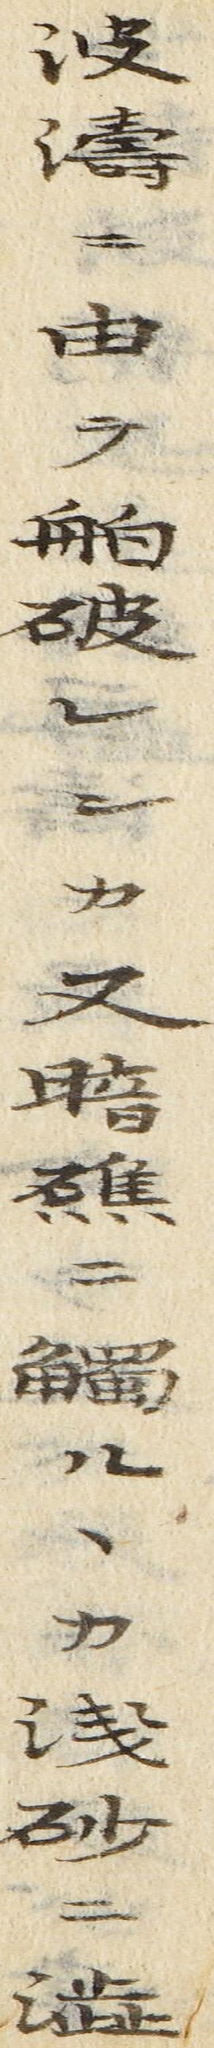波濤ニ由テ舶破レンカ又暗礁ニ触ルヽカ浅砂ニ渋
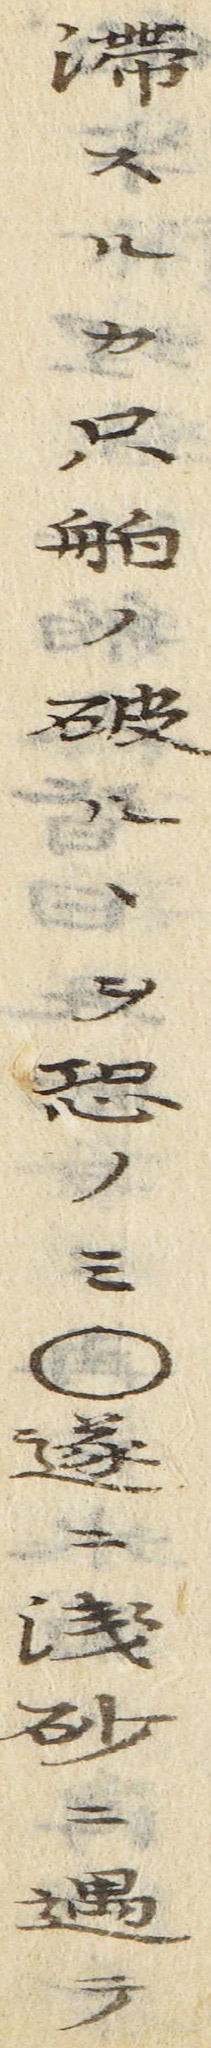滞スルカ只舶ノ破ルヽヲ恐ノミ◯遂ニ浅砂ニ遇テ

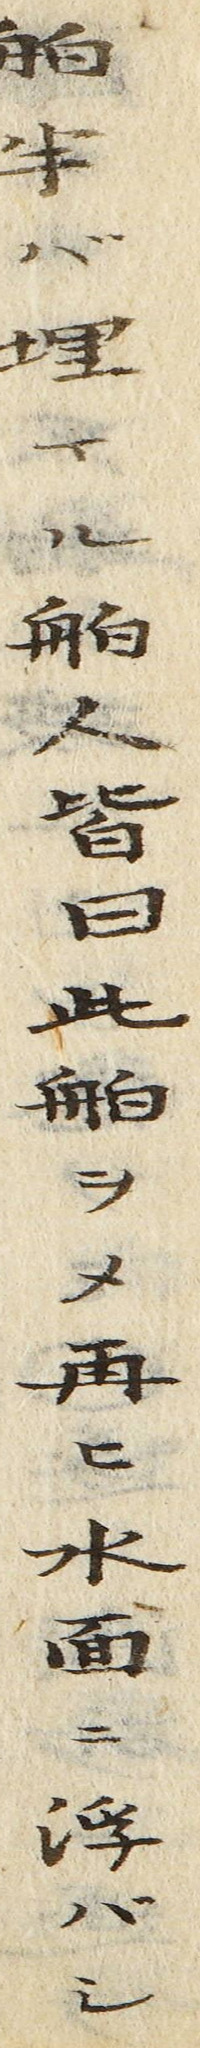舶半バ埋マル舶人皆曰此舶ヲシテ再ヒ水面ニ浮バシ
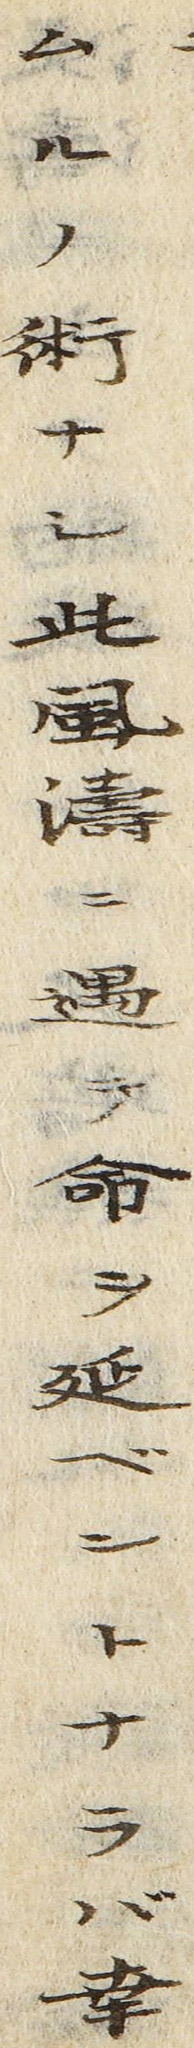ムルノ術ナシ此風濤ニ遇テ命ヲ延ベントナラバ幸
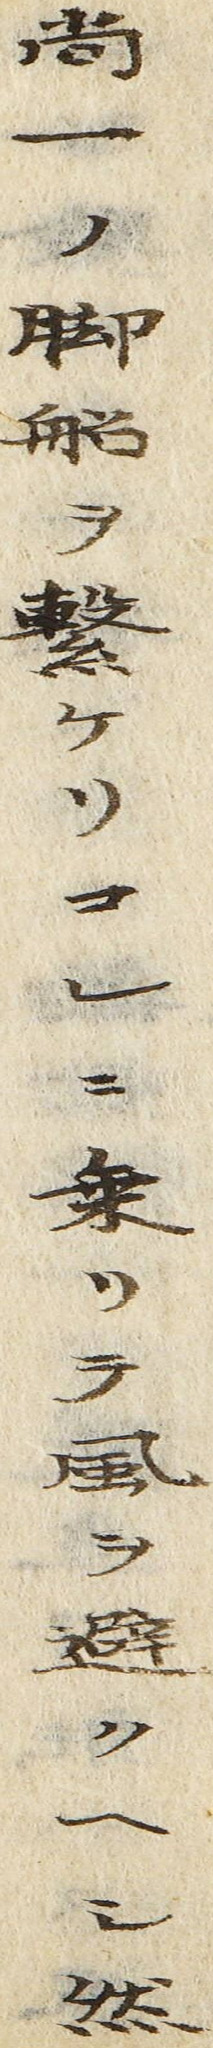尚一ノ脚船を繋ケリコレニ乗リテ風ヲ避クヘシ然
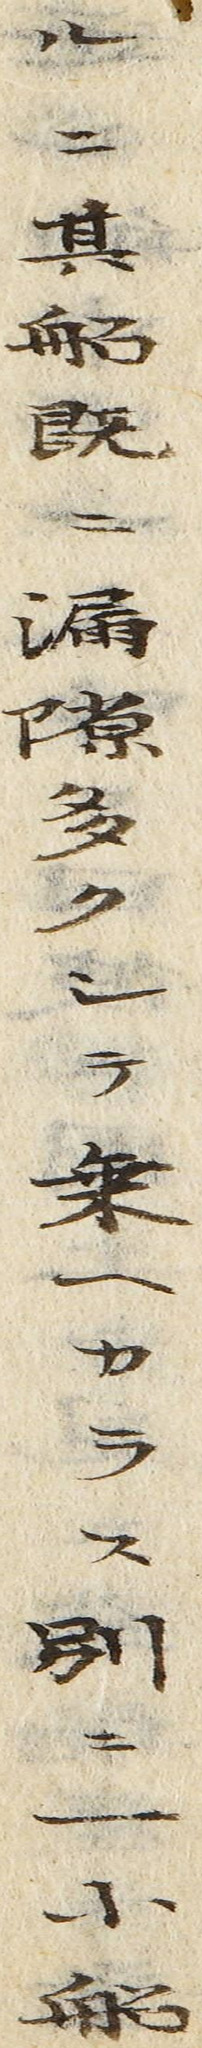ルニ其船既ニ漏隙多クシテ乗ヘカラス別ニ一小船
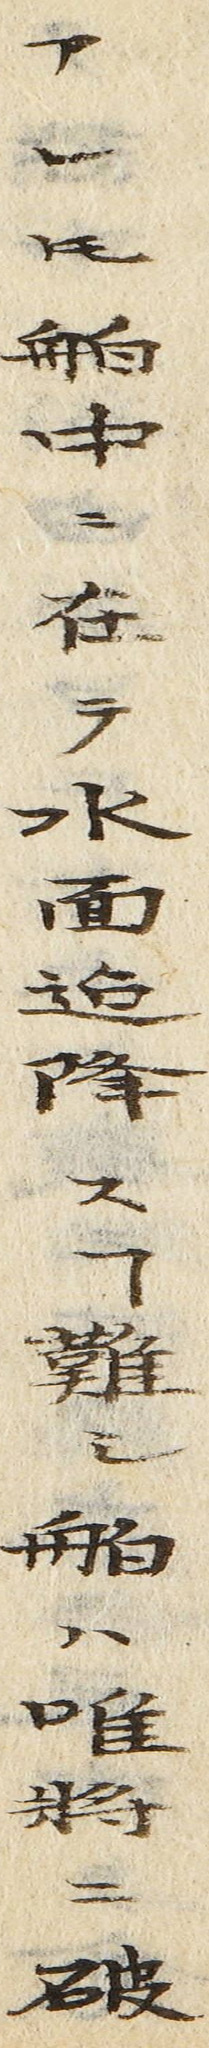アレトモ舶中ニ在テ水面迄降スコト難シ舶ハ唯将ニ破
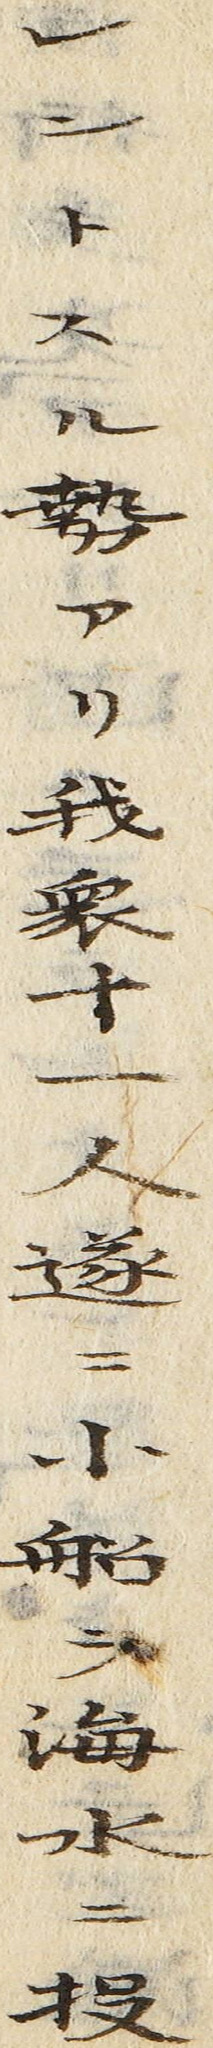レントスル勢アリ我衆十一人遂ニ小船ヲ海水ニ投
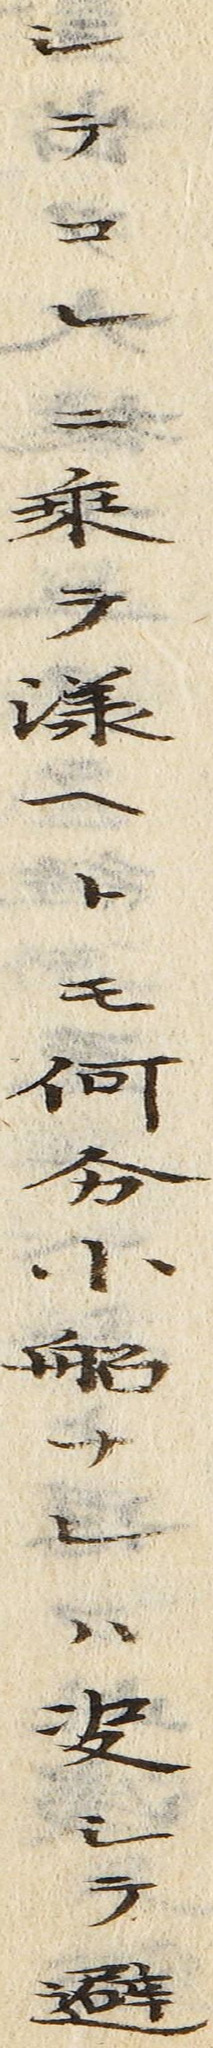シテコレニ乗テ漾ヘトモ何分小船ナレハ決シテ避
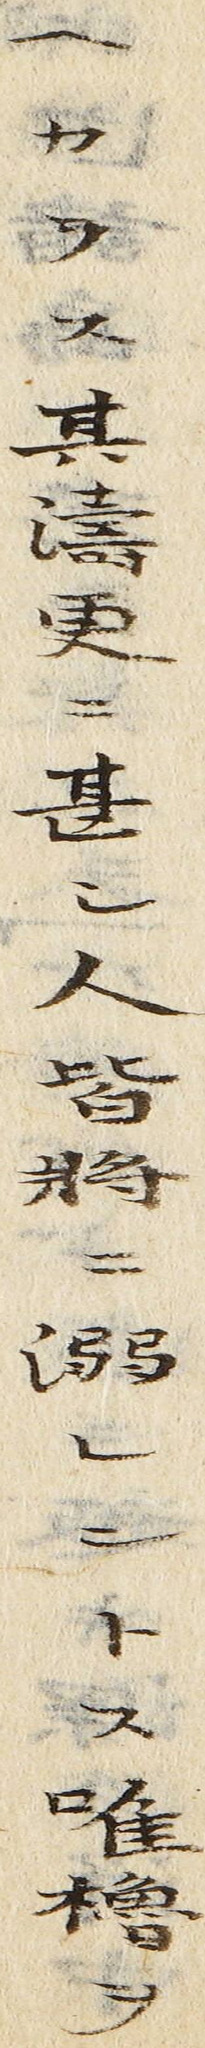ヘカラス其濤更ニ甚シ人皆将ニ溺レントス唯櫓ヲ
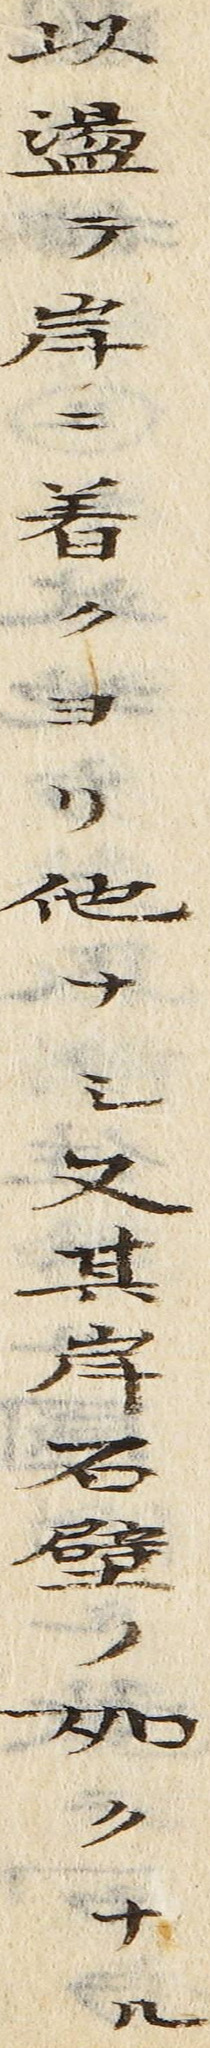以盪テ岸ニ着クヨリ他ナシ又其岸石壁ノ如クナル
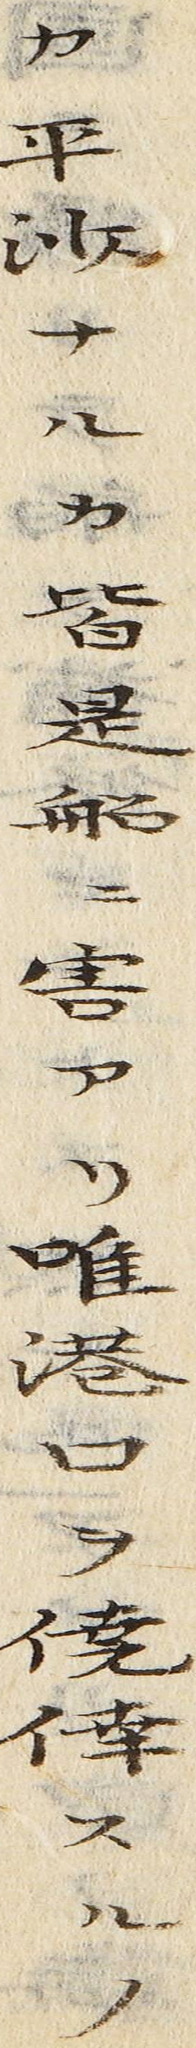カ平沙ナルカ皆是船ニ害アリ唯港口ヲ僥倖スルノ
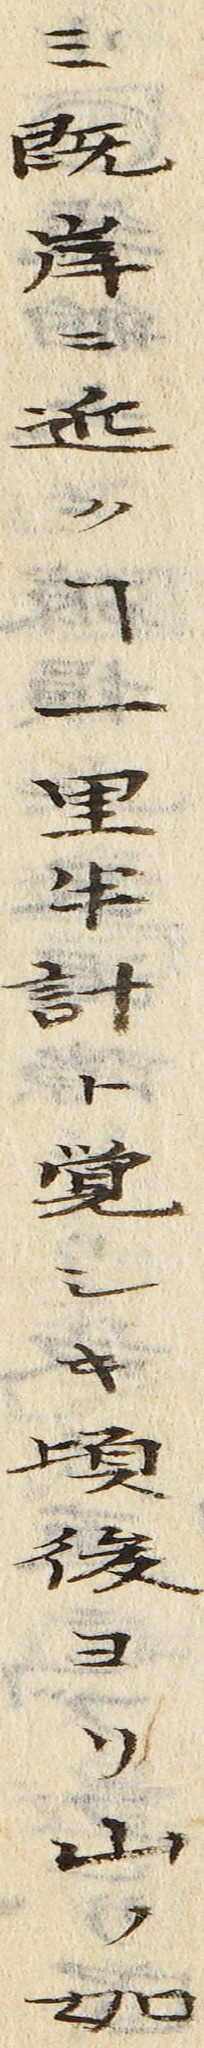ミ既岸ニ近クコト一里半計ト覚シキ頃後ヨリ山ノ如
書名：漂流紀事
